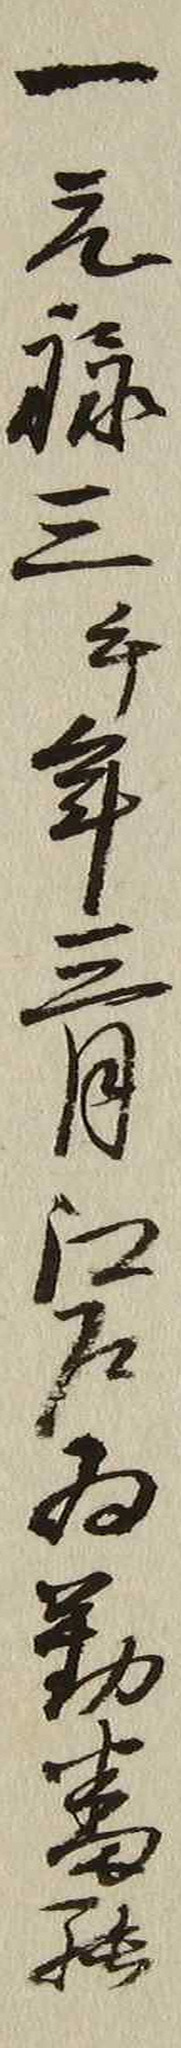一元禄三午年三月江戸為勤番罷
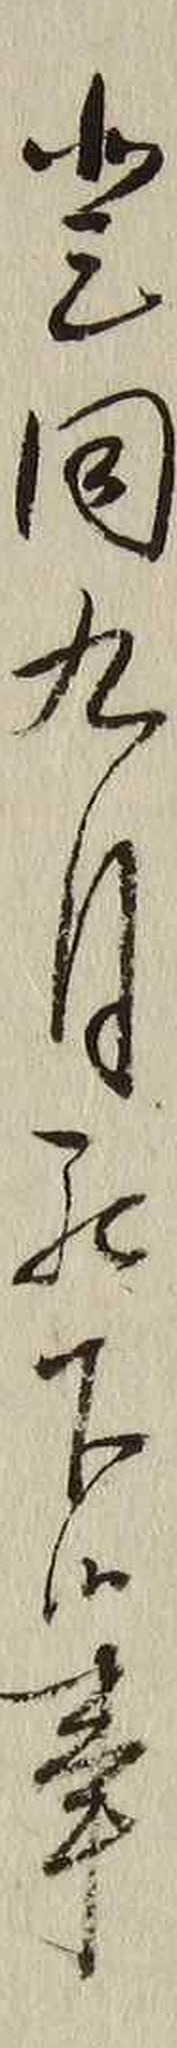登同九月罷下候事
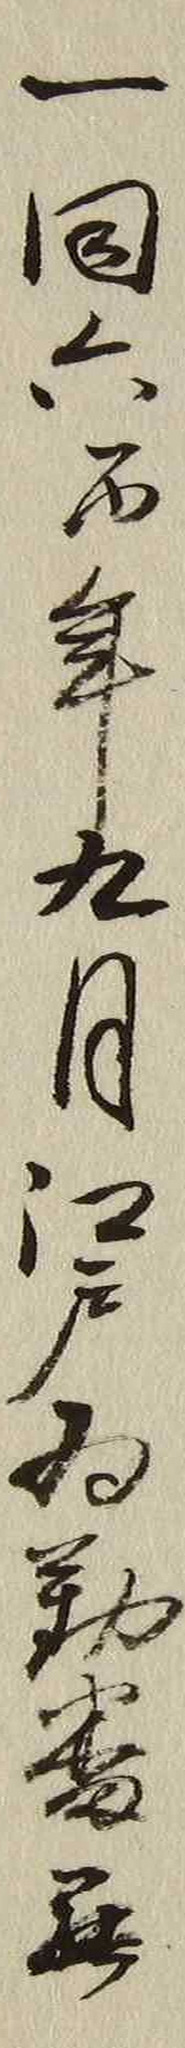一同六酉年九月江戸為勤番罷
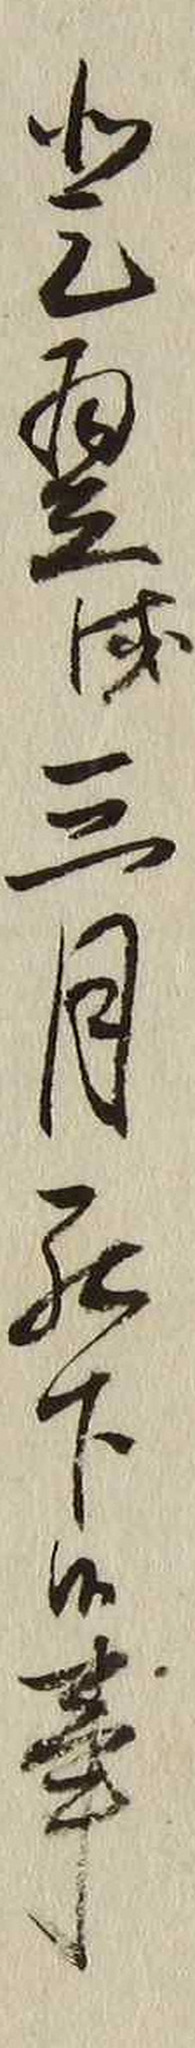登翌戌三月罷下候事
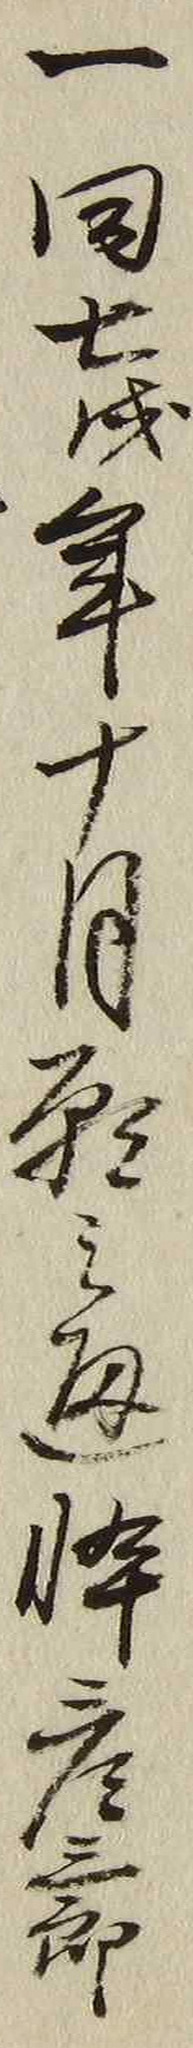一同七戌年十月願之通忰彦三郎
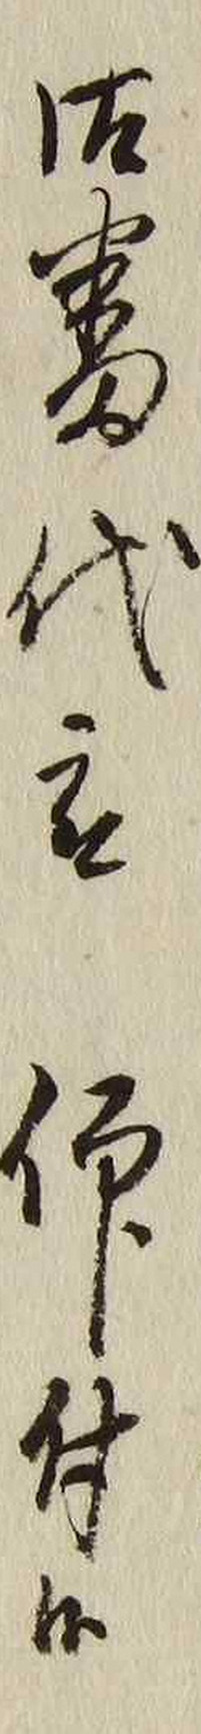御番代被仰付候
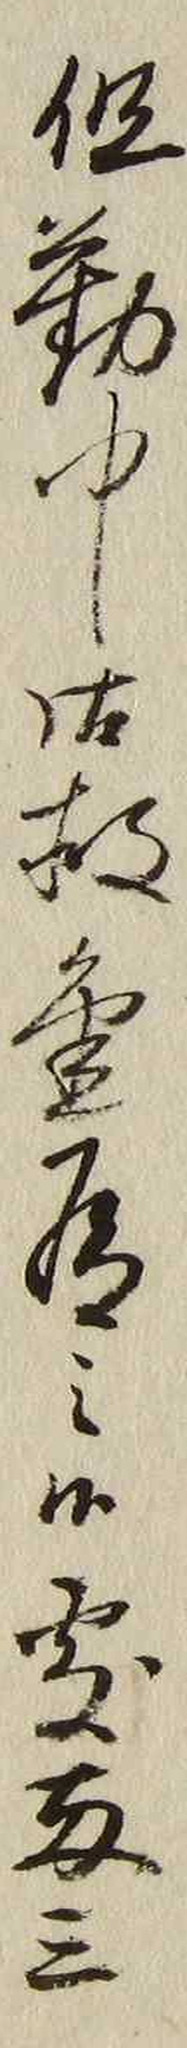但勤中御救金有之候処両三
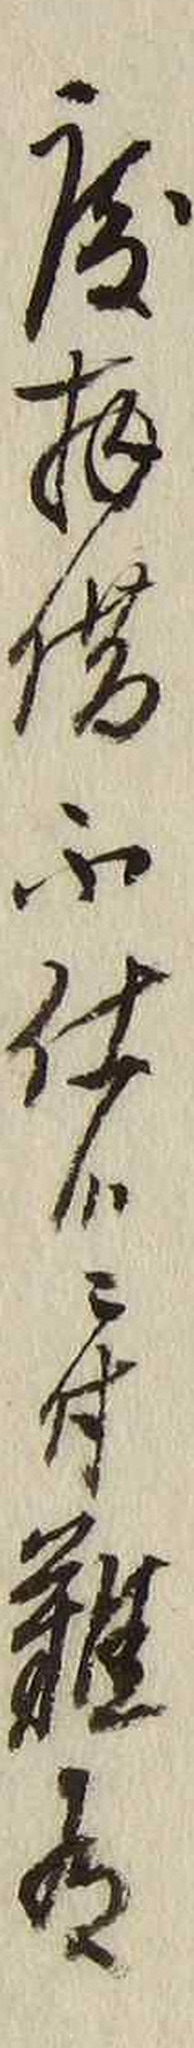度拝借不仕候ニ付難有
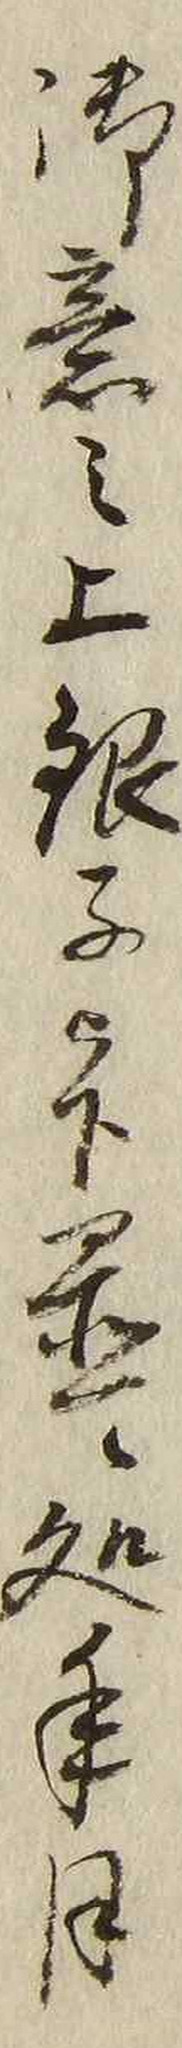御意之上銀子被下置候処年月

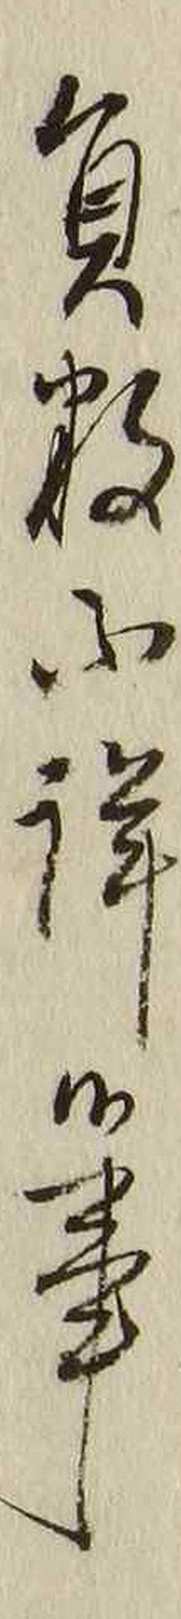員数不詳候事
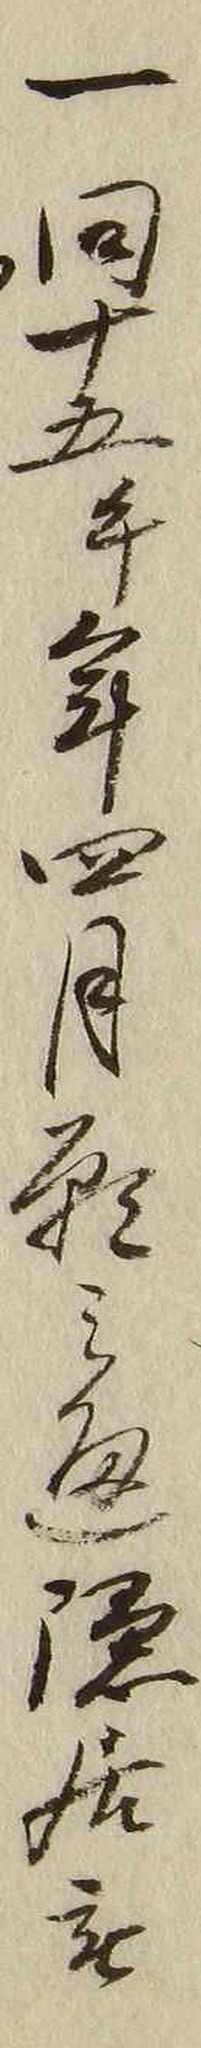一同十五午年四月願之通隠居被
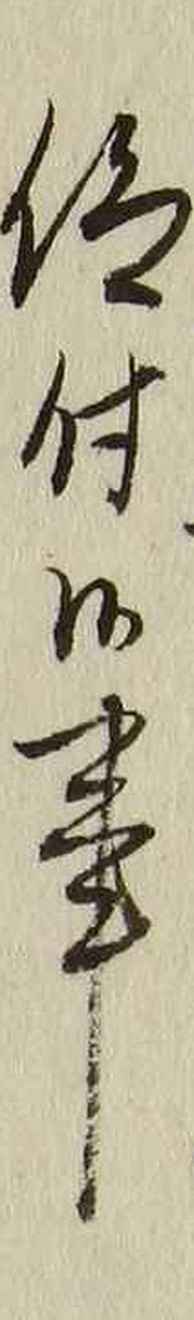仰付候事
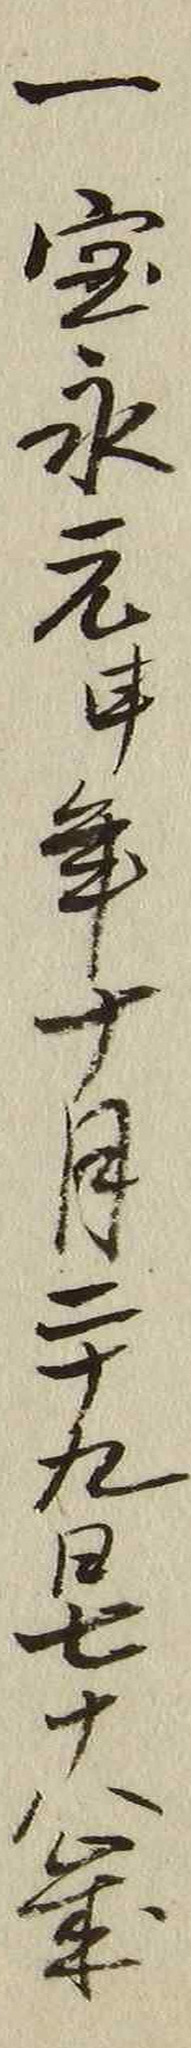一宝永元申年十月二十九日七十八歳
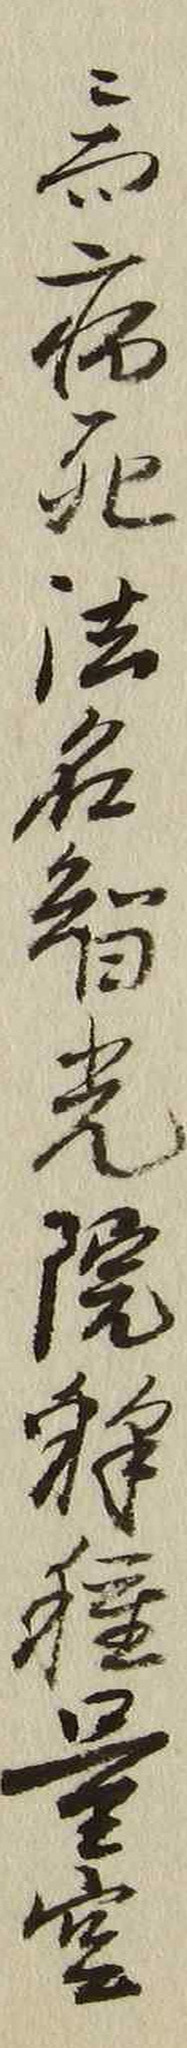ニ而病死法名智光院釈種量空
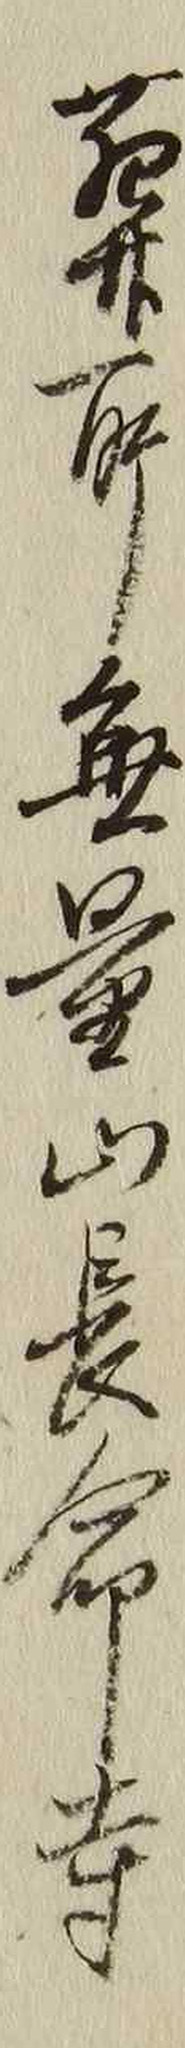葬所無量山長命寺
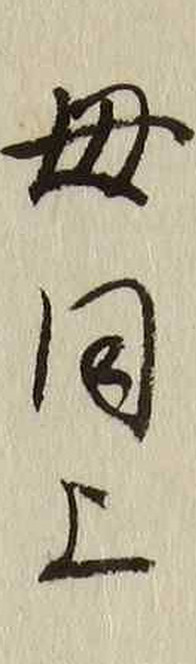母同上
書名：諸士系譜　巻之356　す之部6
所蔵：会津若松市立会津図書館
